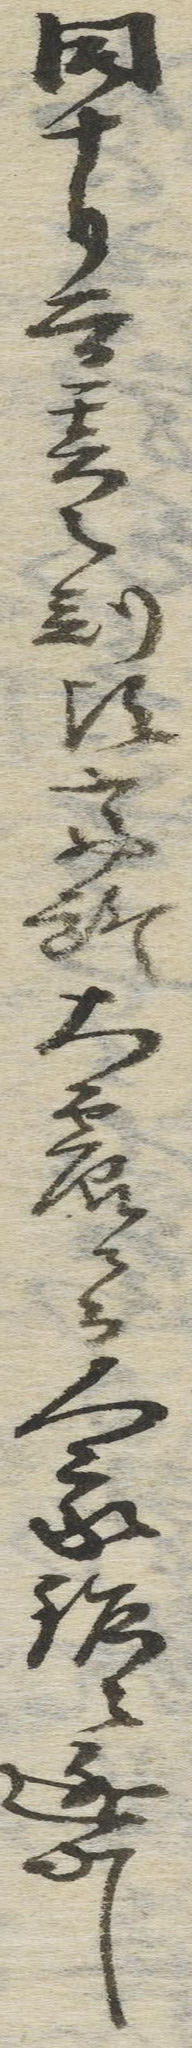同十月二日亥之刻頃当所大震二而人家銘々逃出し
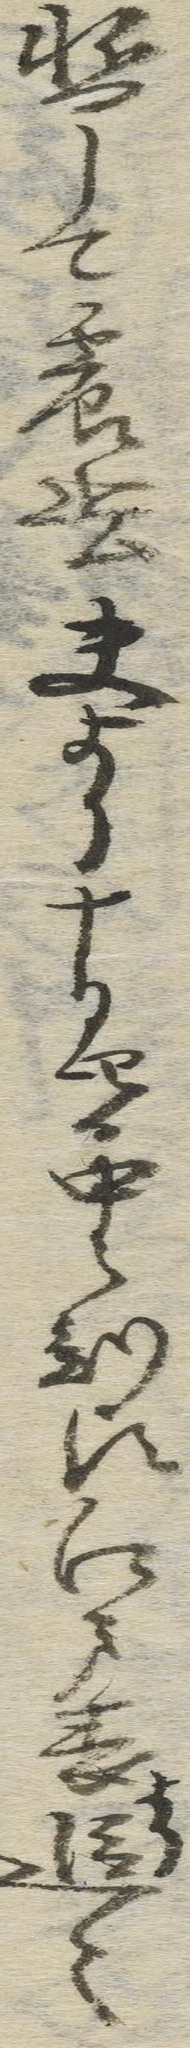暫して震止ム夫より十月四日申之刻頃江戸表より追々
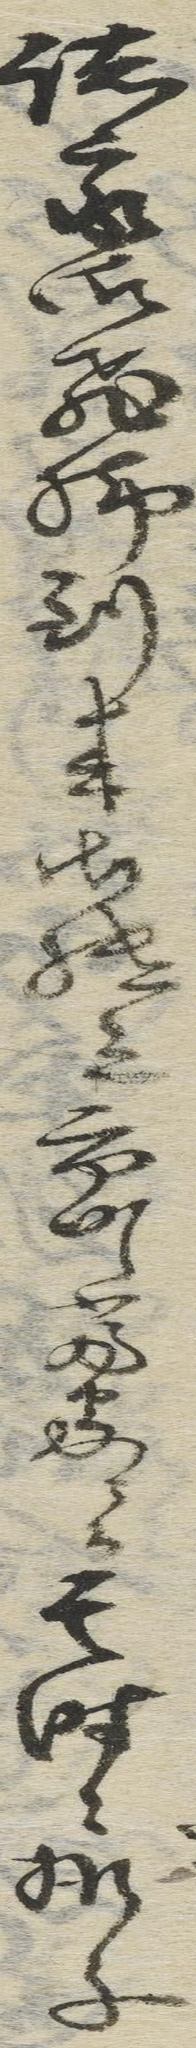諸家御飛脚到来御継立市町当家二而其時々様子
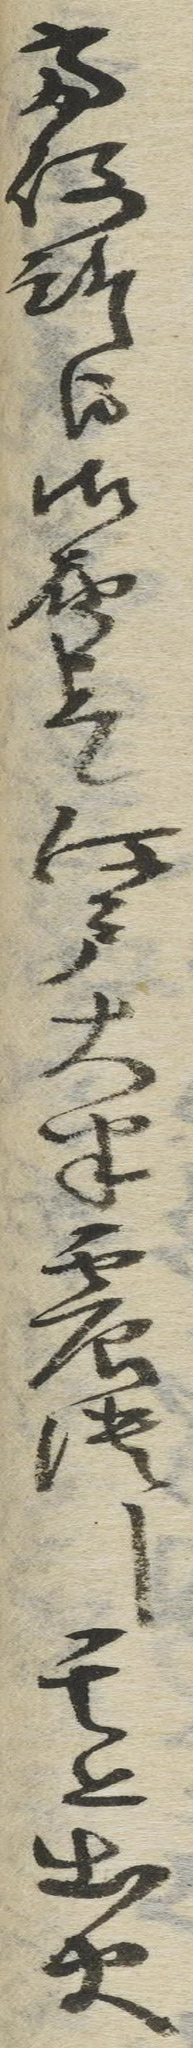当役所江御届申上候江戸大半震潰し其上出火
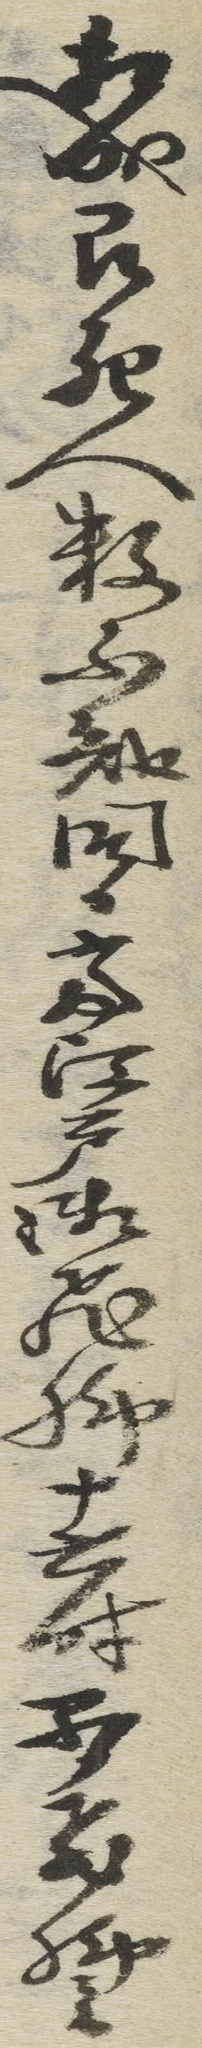相成即死人数不知同日江戸御飛脚十六時早飛脚二而
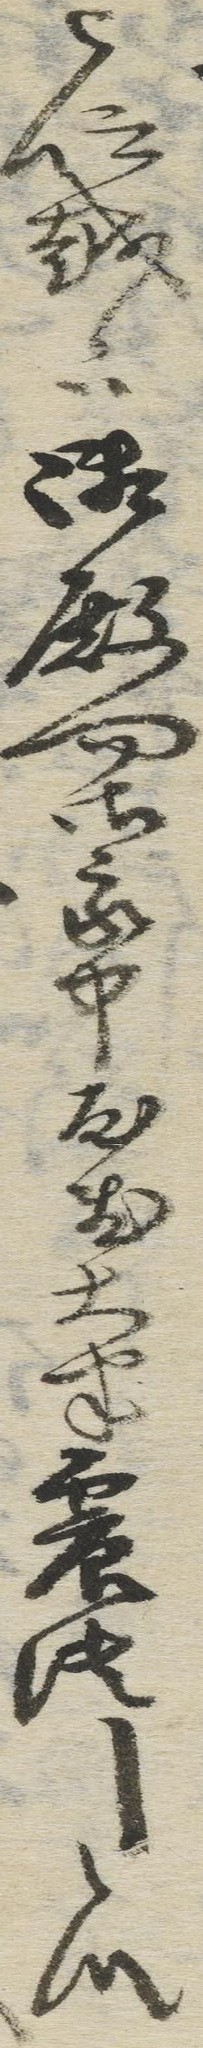被仰越候ハ御殿向御家中屋敷大半震潰し候段
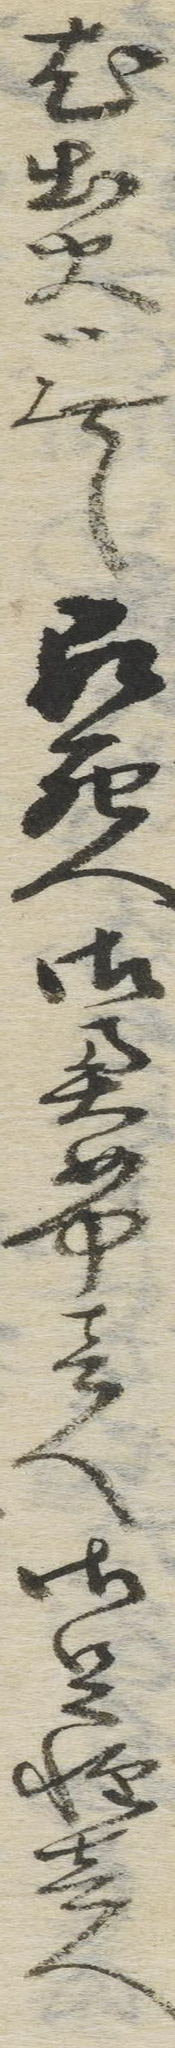尤出火ハ無之即死人御奥女中壱人御足軽壱人
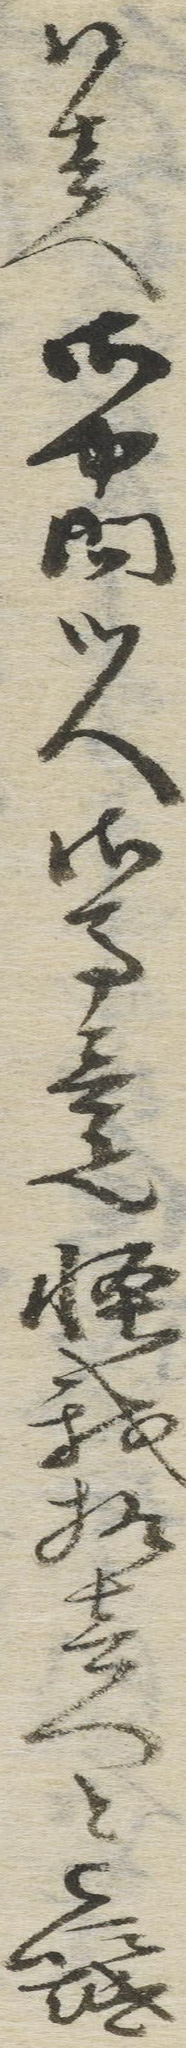同壱人御中間弐人御馬壱疋怪我拾壱人と被仰越候
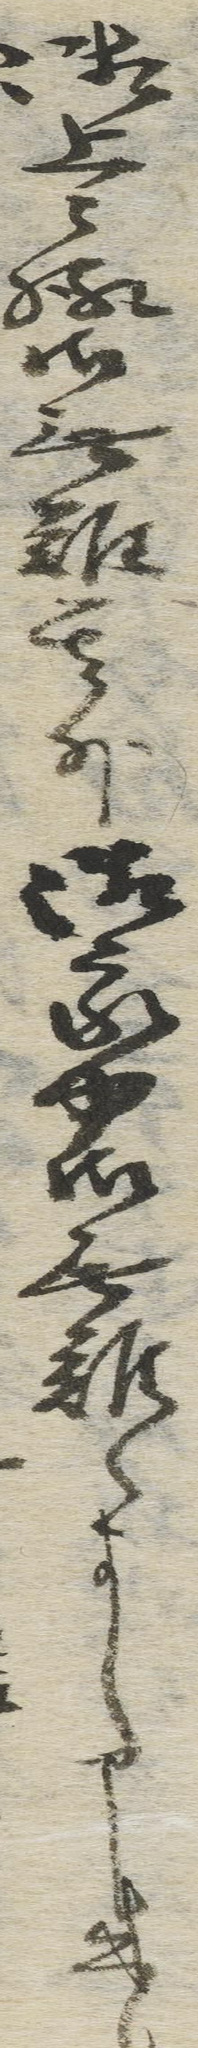御上々様御無難其外御家中御無難之よし申来候
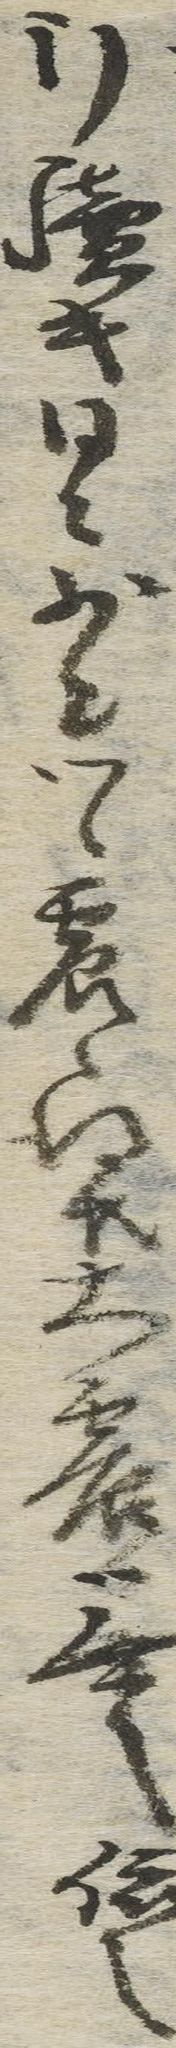引続キ日々少々ツゝ震候得共大震ハ無之依之
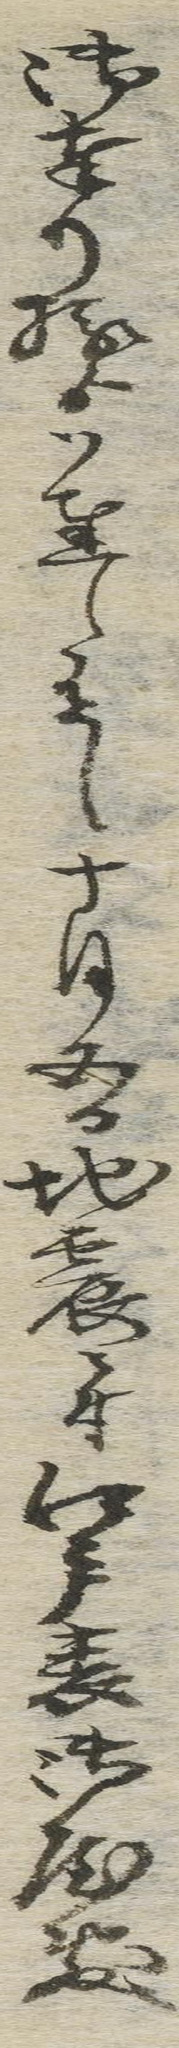御奉行様ゟ御達し有之十月五日地震二付江戸表御屋敷
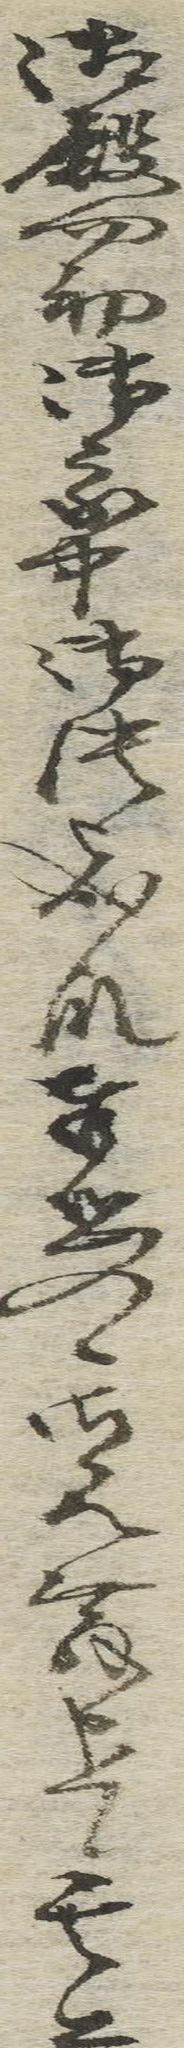御殿向初御家中御潰被成段奉恐入候御見舞申上候其上
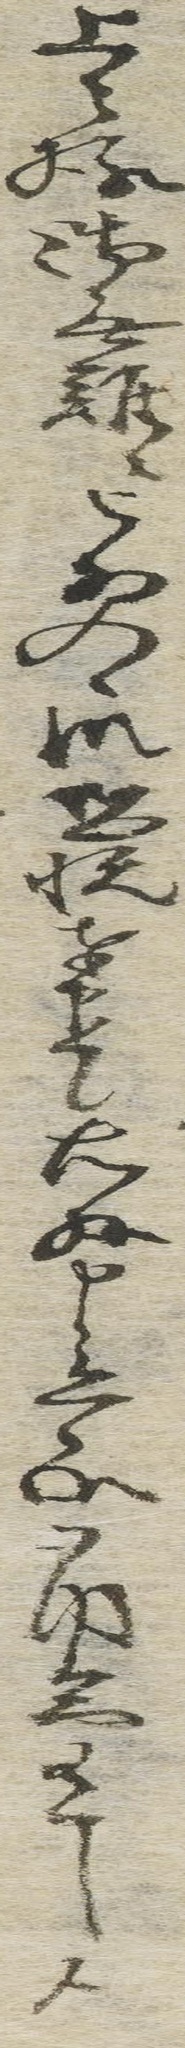上々様御無難二被為入候段恐悦奉申上候右為申上候処御内意有之候
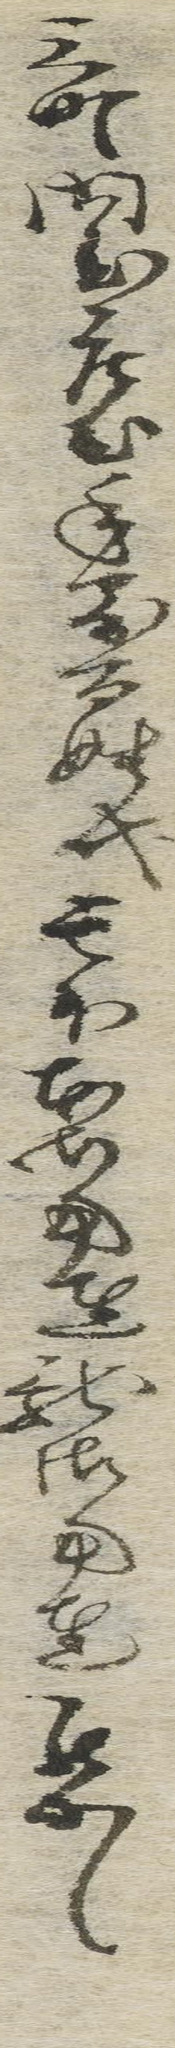三町問屋庄屋年寄百姓代其外本御用達新御用達罷出候
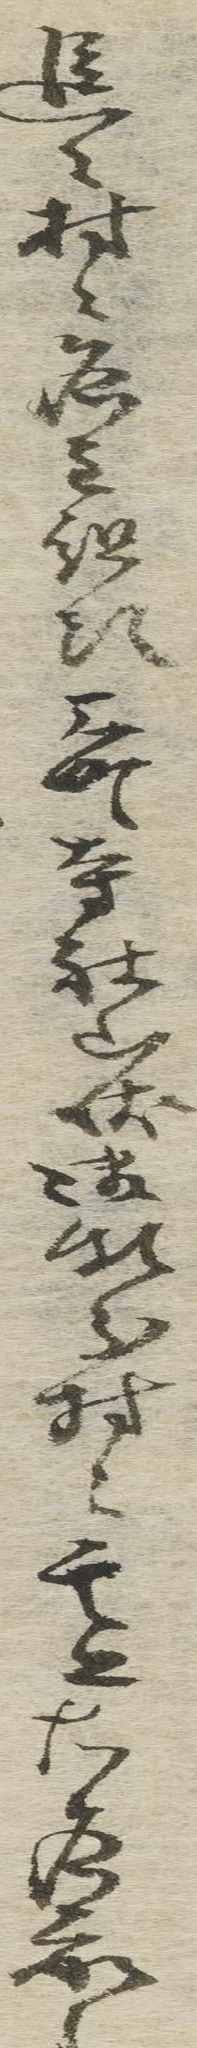追々村々名主組頭在町寺社山伏御領分村々其上右小前之
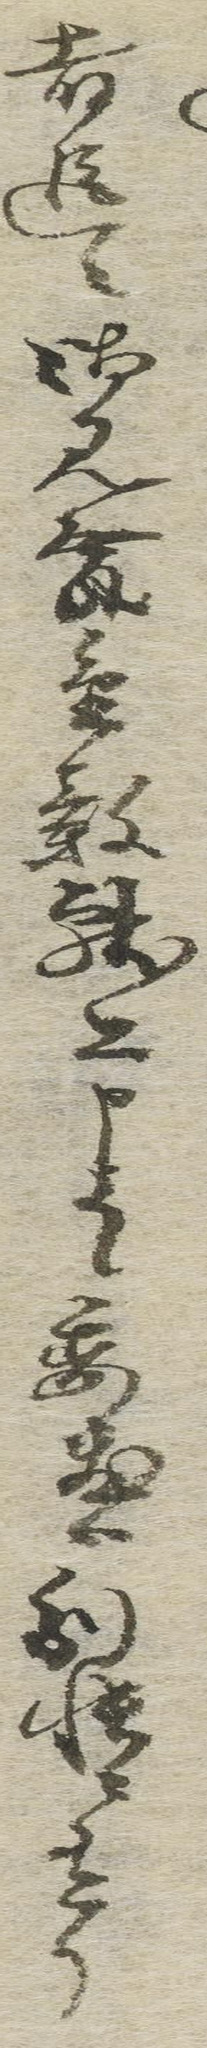者追々御見舞米穀献上申上候委敷ハ別帳二有り
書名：信濃越後　地震書留
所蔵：東京大学地震研究所図書室 Earthquake Research Institute Library, The University of Tokyo, JAPAN
